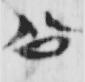公
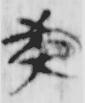族
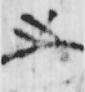之
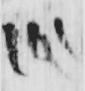州
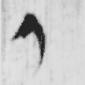人
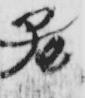孫
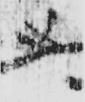止
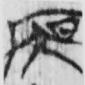昃
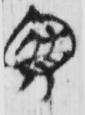府
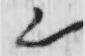乙
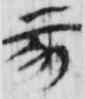亥
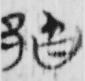邮
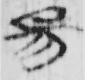昜（陽）
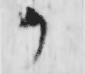人
